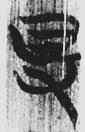○（得）
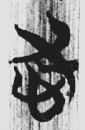忧（尤）
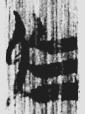於
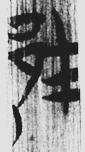邦
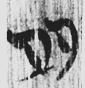多
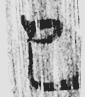巳（已）
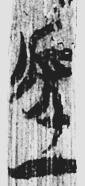○（吾）
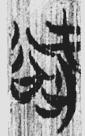欲
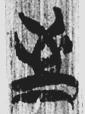至（致）
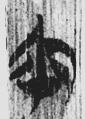尔（爾）
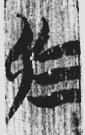於
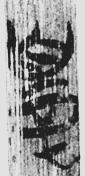辠（罪）
